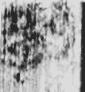○（荆）
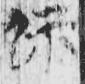𫵖
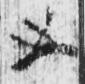之
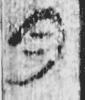月
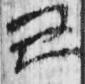己
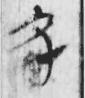丑
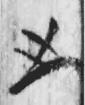之
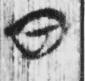日
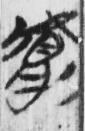膚
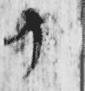人
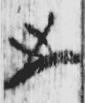之
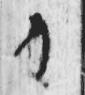人
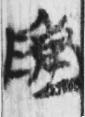○（陳）
